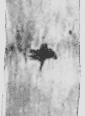十
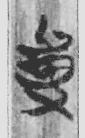尃
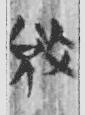敓（說）
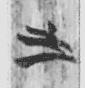之
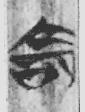命
